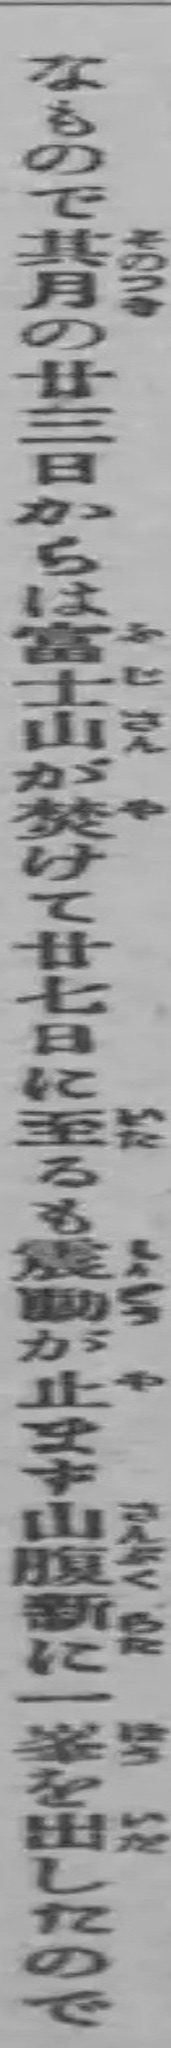なもので其月の廿三日からは富士山が焚けて廿七日に至るも震動が止まず山腹新に一峯を出したので
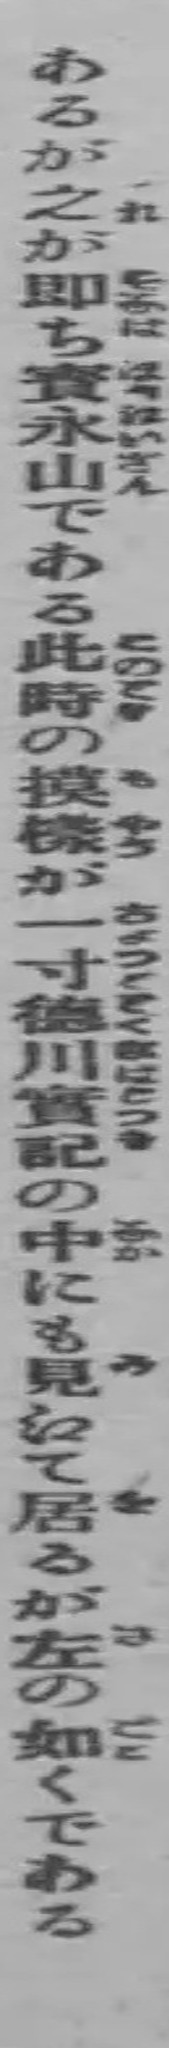あるが之が即ち宝永山である此時の模様が一寸徳川実記の中にも見えて居るが左の如くである
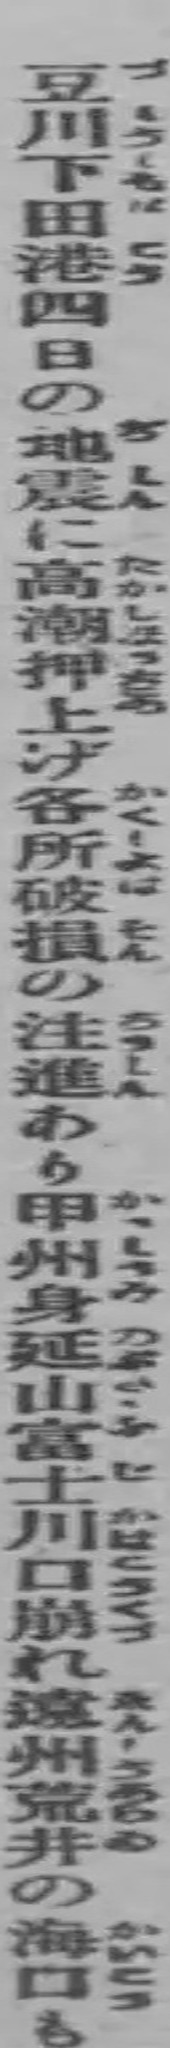豆川下田港四日の地震に高潮押上げ各所破損の注進あり甲州見延山富士川口崩れ遠州荒井の海口も
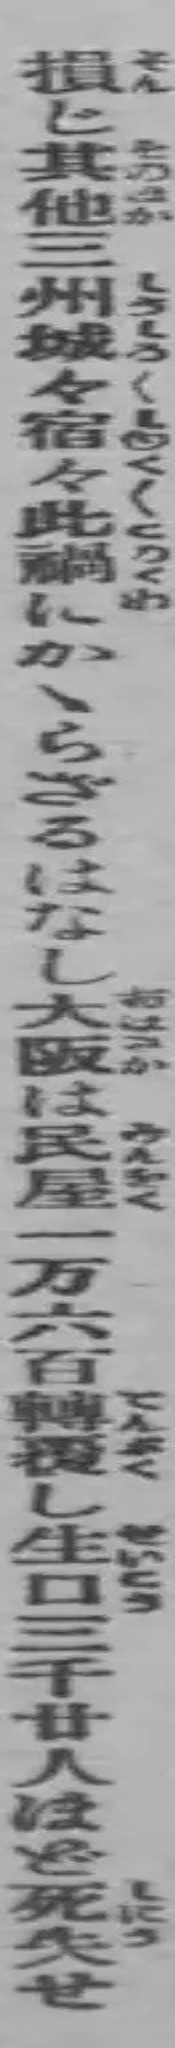損じ其他三州城々宿々此禍にかゝらざるはなし大阪は民屋一万六百転覆し生口三千廿人ほど死失せ
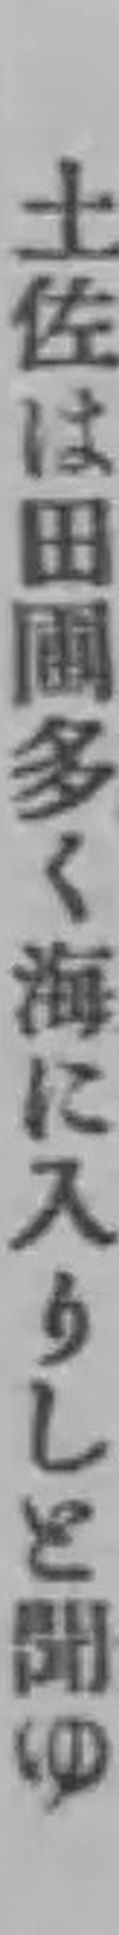土佐は田圃多く海に入りしと聞ゆ
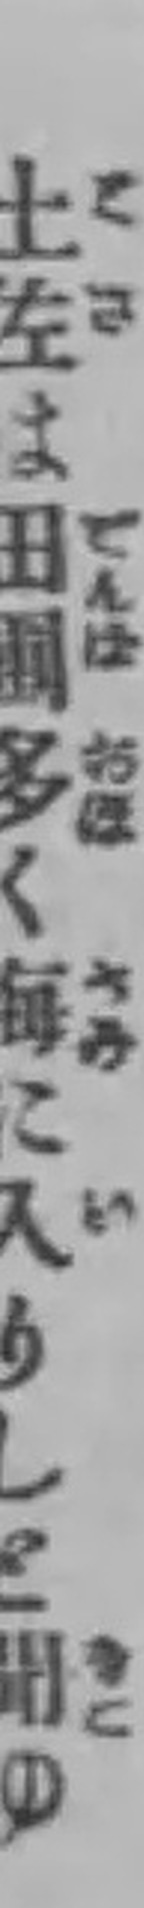土佐は田圃多く海に入りしと聞ゆ
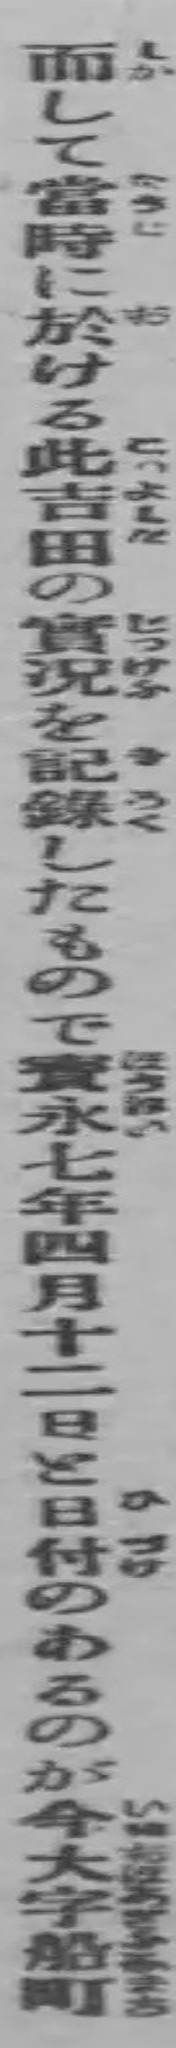而して当時に於る此吉田の実況を記録したもので宝永七年四月十二日と日付のあるのが今大字船町
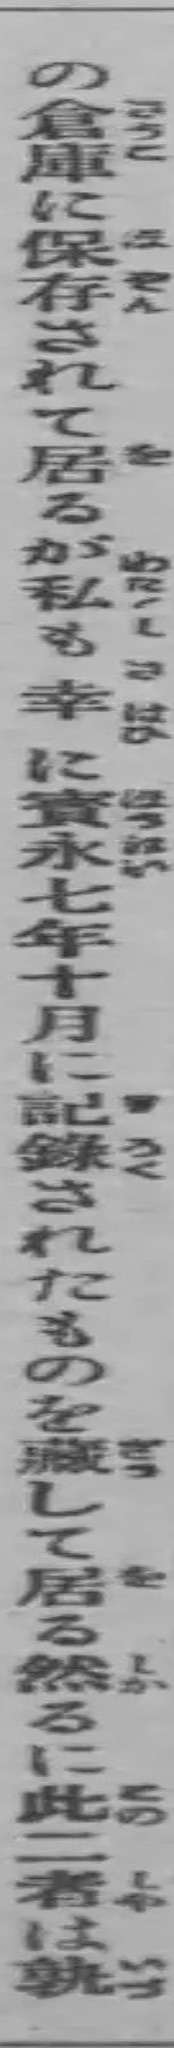の倉庫に保存されて居るが私も幸に宝永七年十月に記録されたものを蔵して居る然るに此二者は孰
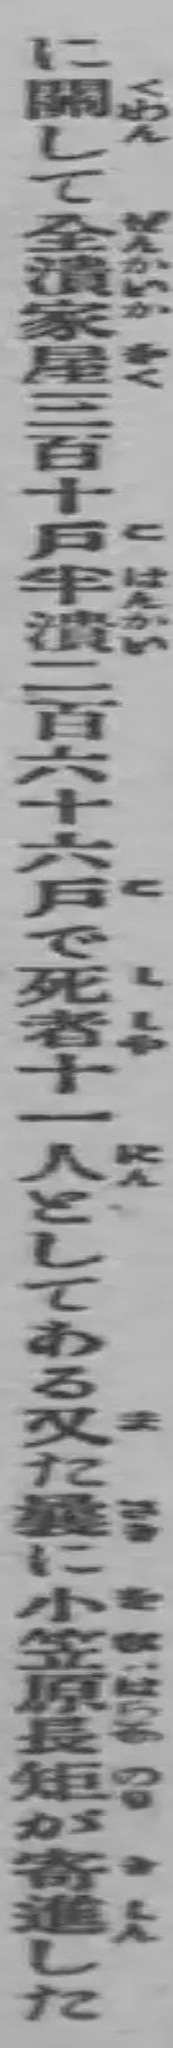に関して全潰家屋三百十戸半潰二百六十六戸で死者十一人としてある又た曩に小笠原長矩が寄進した
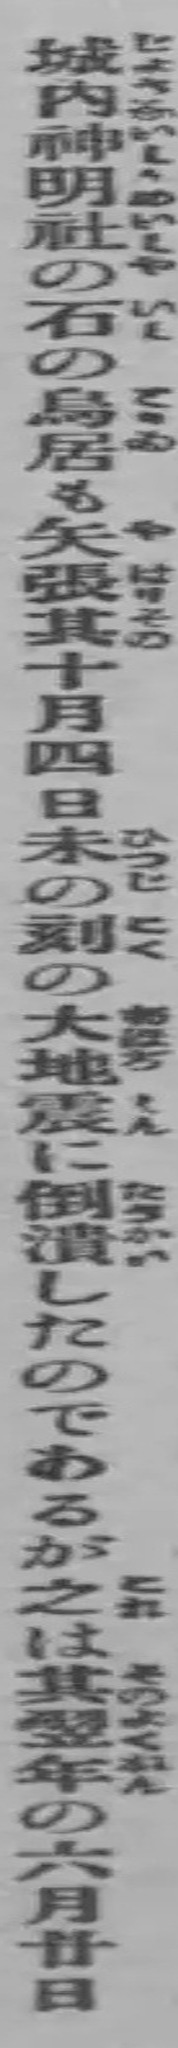城内神明社の石の鳥居も矢張其十月四日未の刻の大地震に倒潰したのであるが之は其翌年の六月廿日
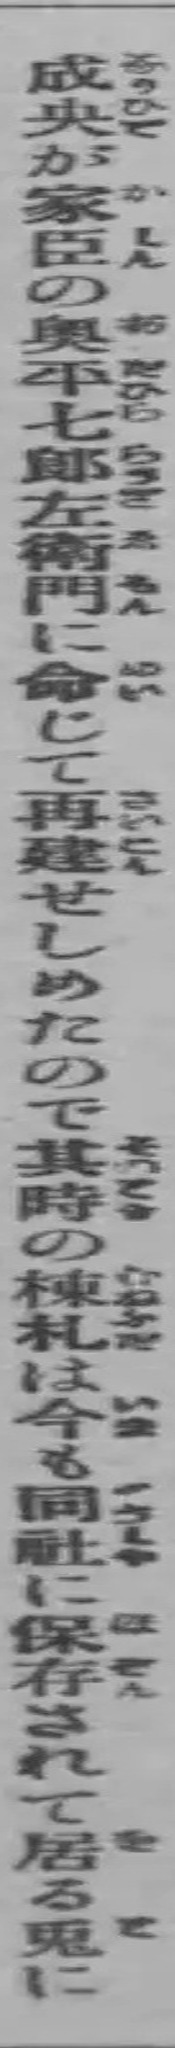成央が家臣の奥平七郎左衛門に命じて再建せしめたので其時の棟札は今も同社に保存されて居る兎に
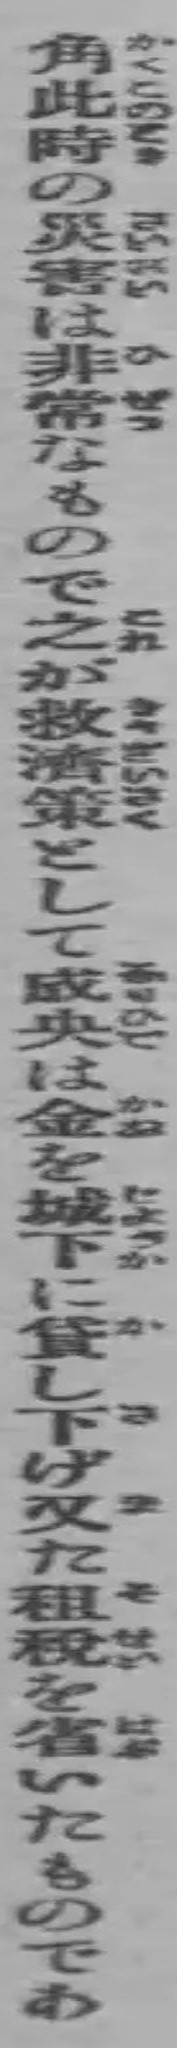災害の救済角此時の災害は非常なもので之が救済策として成央は金を城下に貸し下げ又た租税を省いたものであ

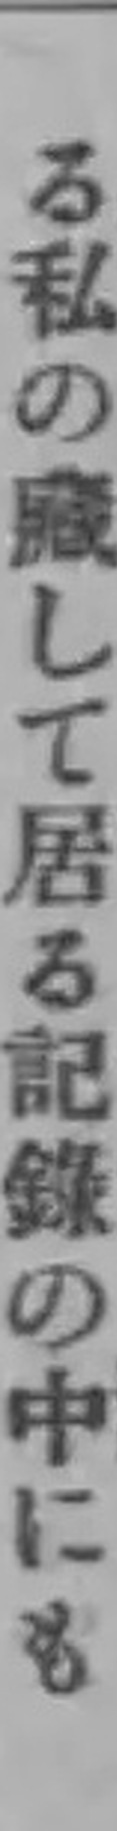る私の蔵して居る記録の中にも
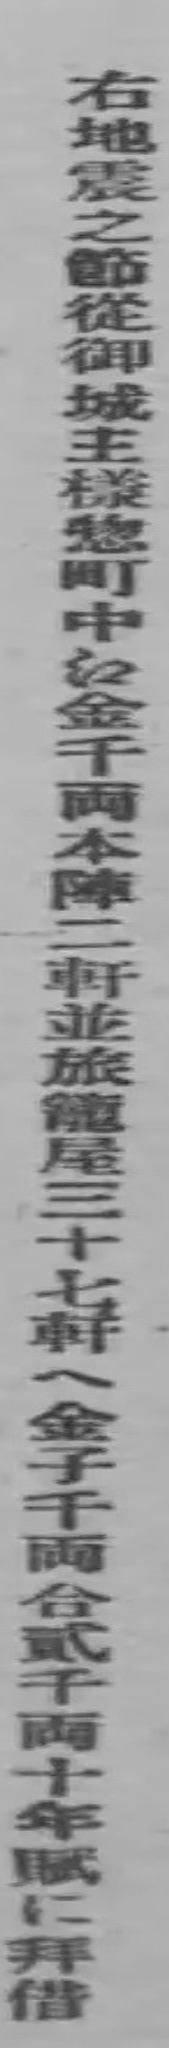右地震之節従御城主様惣町中え金千両本陣二軒並旅籠屋三十七軒へ金子千両合弐千両十年賦に拝借
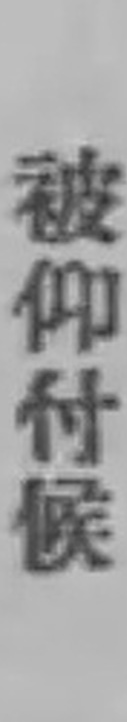被仰付候
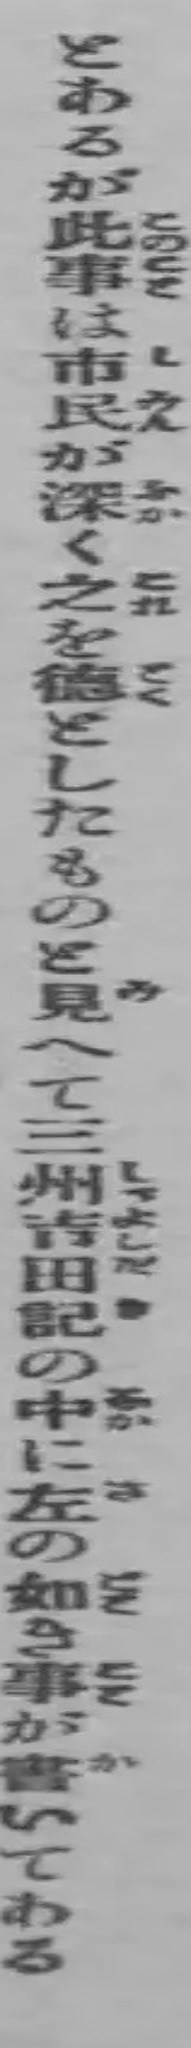とあるが此事は市民が深く之を徳としたものと見へて三州吉田記の中に左の如き事が書いてある
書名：豊橋市史談
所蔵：国立国会図書館 National Diet Library, JAPAN
